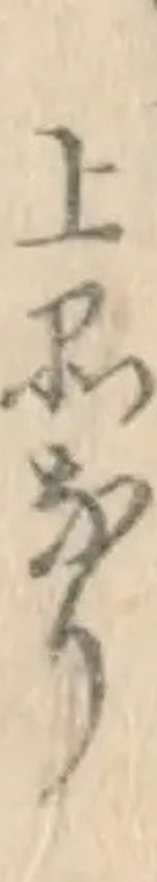上品なり
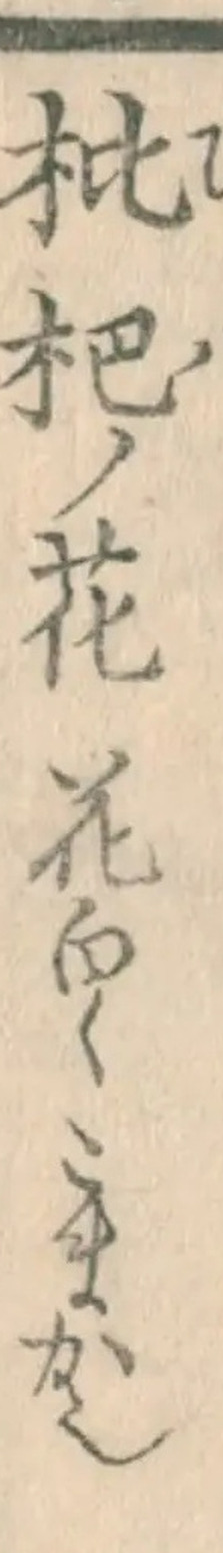枇杷ノ花花白くこまか也
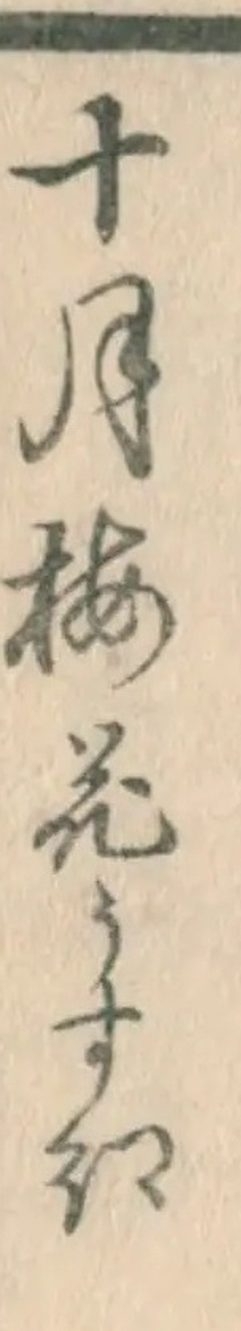十月梅花うす紅
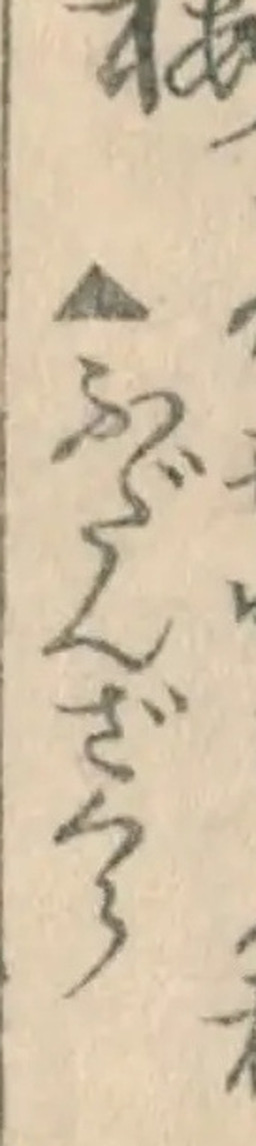▲ふだんざくら
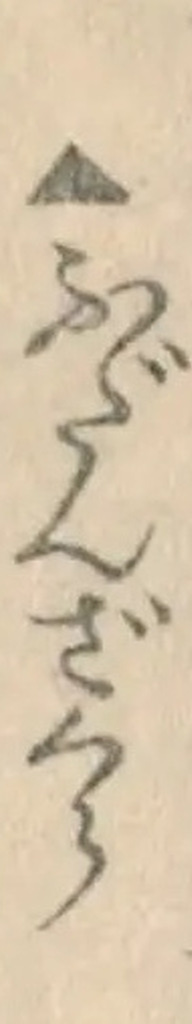▲ふだんざくら

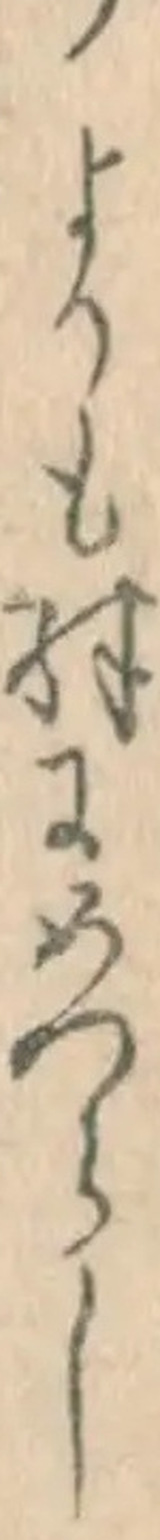よりも時にめつらし
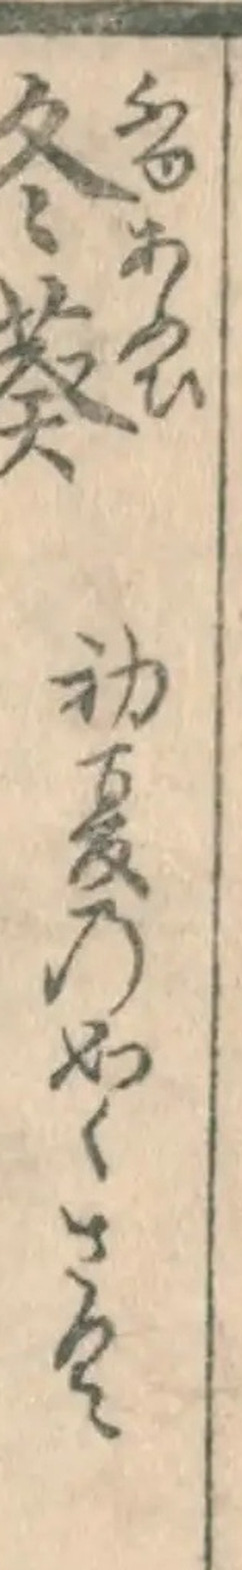冬葵初夏の如くさ
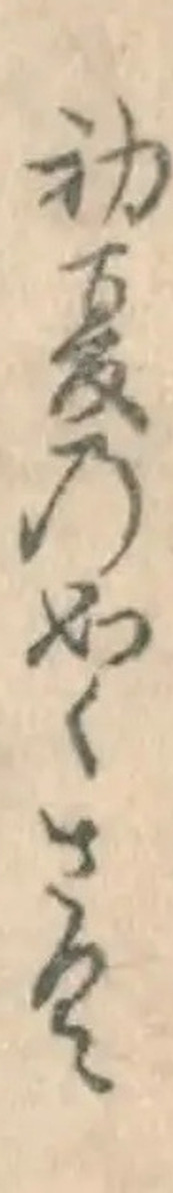冬葵初夏の如くさ
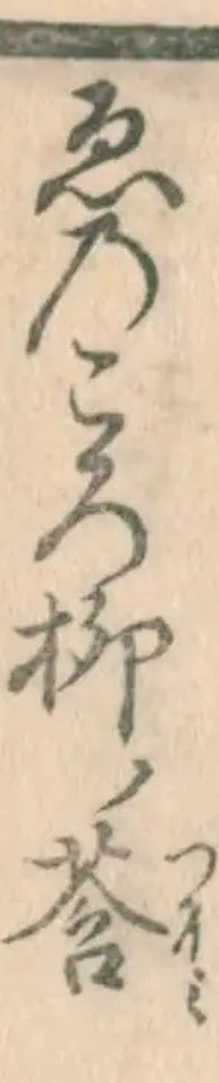ゑのころ柳ノ莟
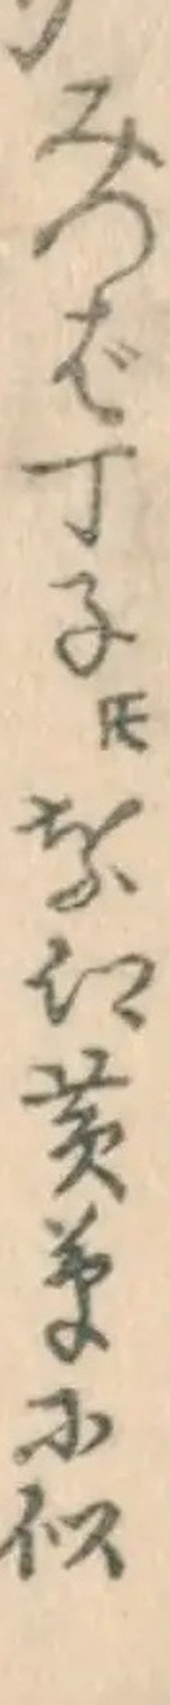千寿菊みつば丁子共葉紅黄草に似
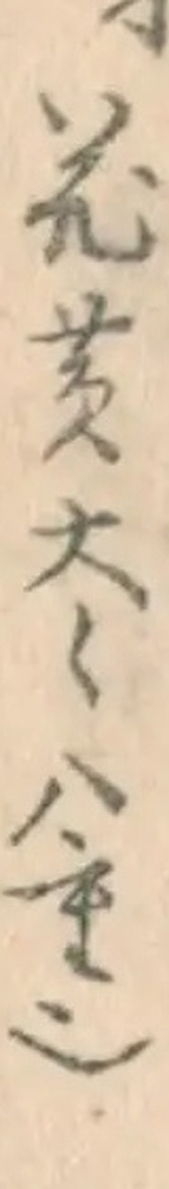花黄大々八重也
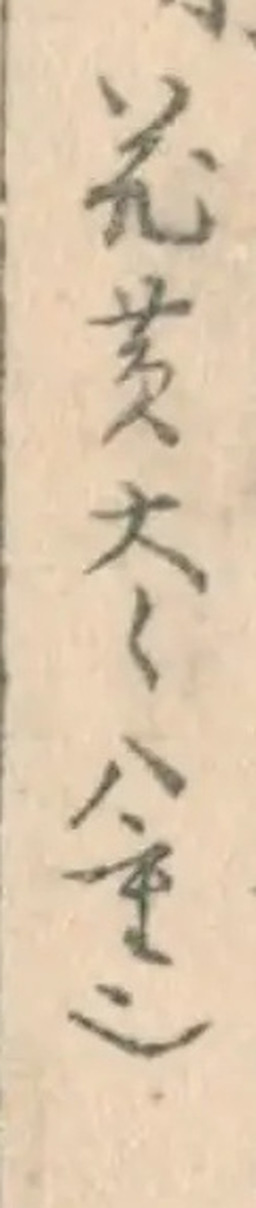花黄大々八重也
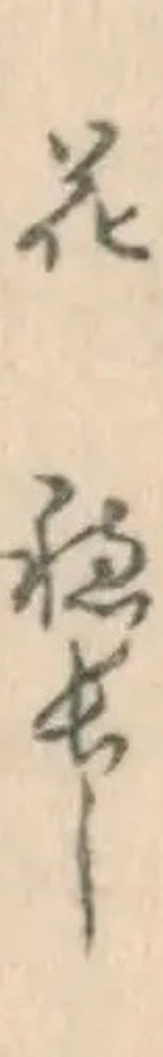花穂長し
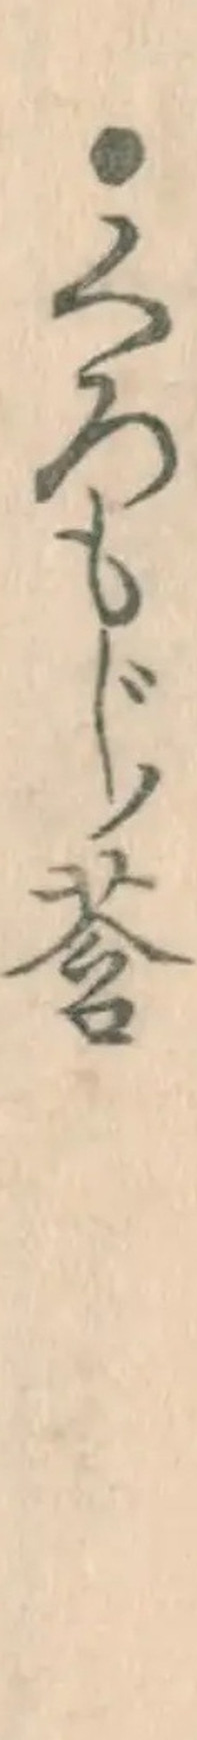●くろもじノ莟
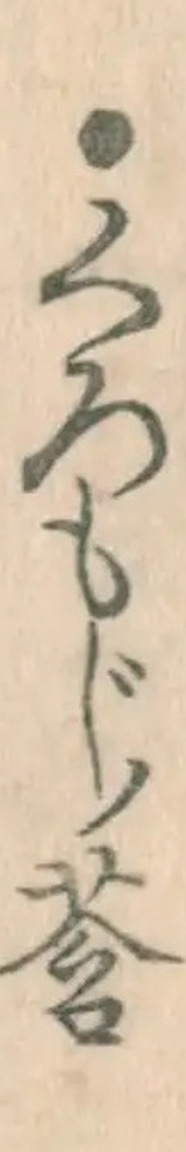●くろもじノ莟
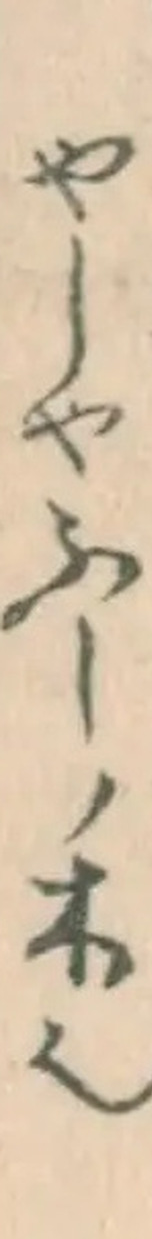やしやふしのノ木
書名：茶席挿花集
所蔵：国立国会図書館 National Diet Library, JAPAN
